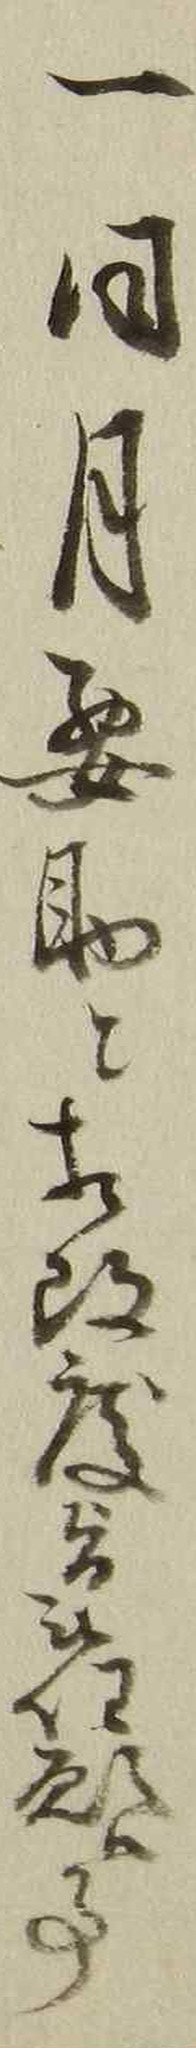一同月要助と相改度旨被任願候事
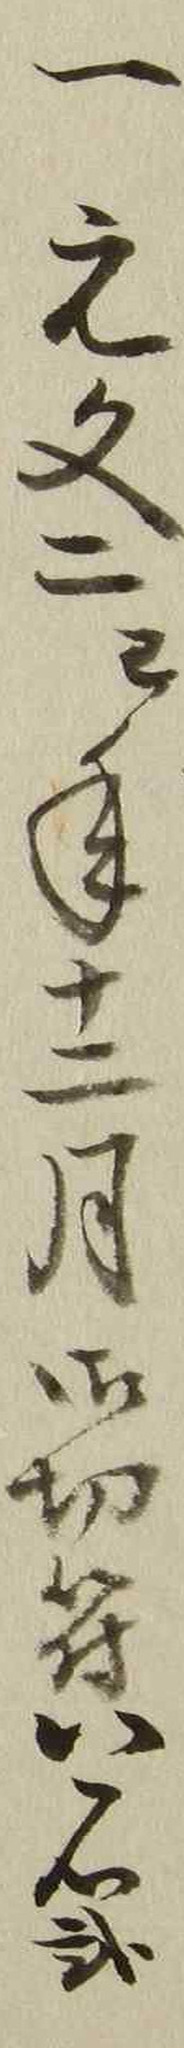一元文二巳年十二月御切符八石弐
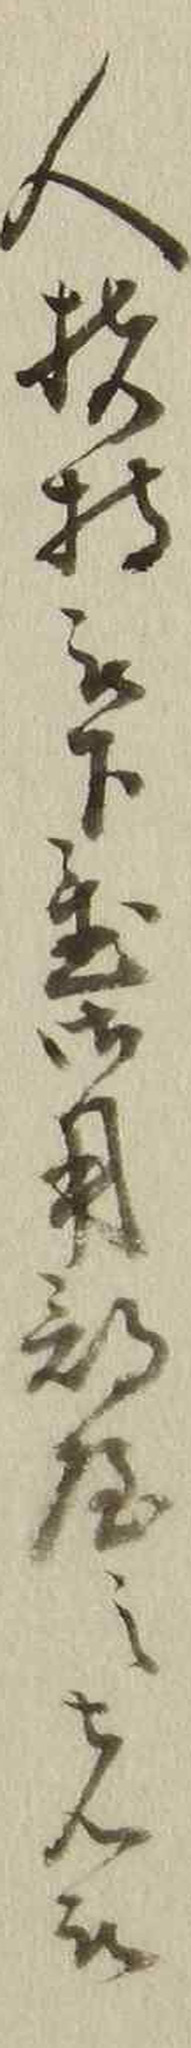人扶持被下置御用部屋之者被
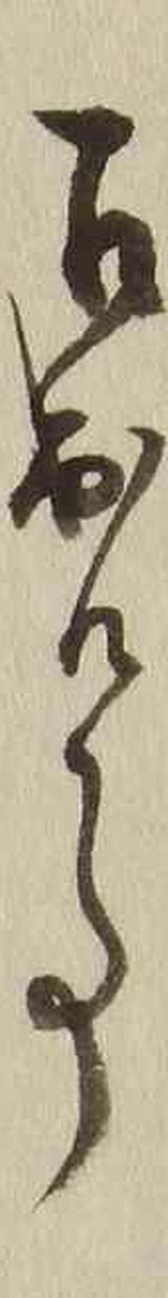召出候事
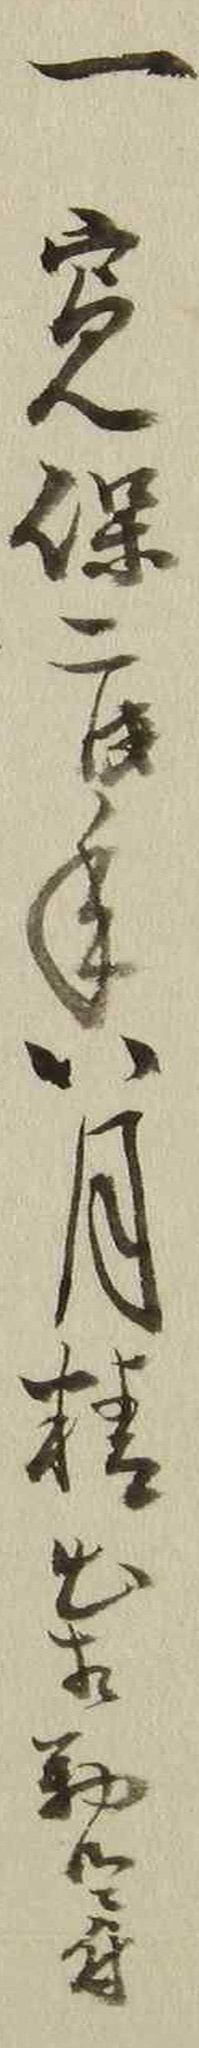一寛保二戌年八月精出相勤候ニ付
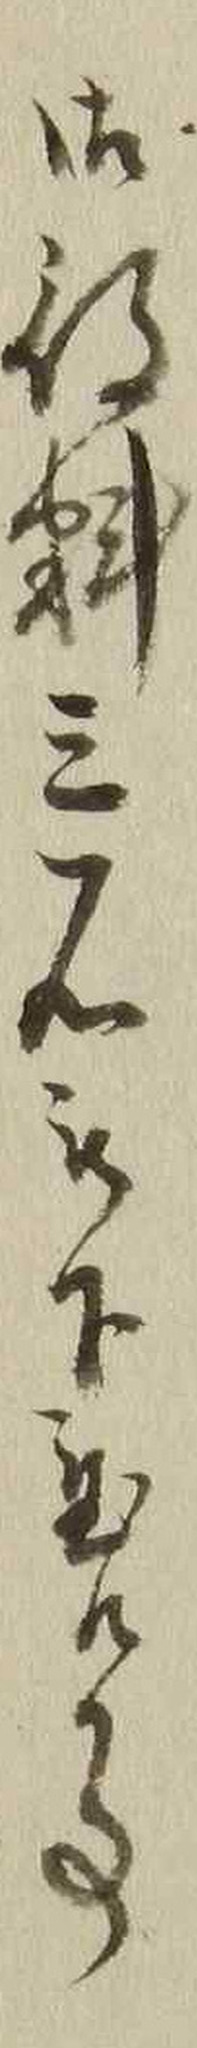御役料三石被下置候事
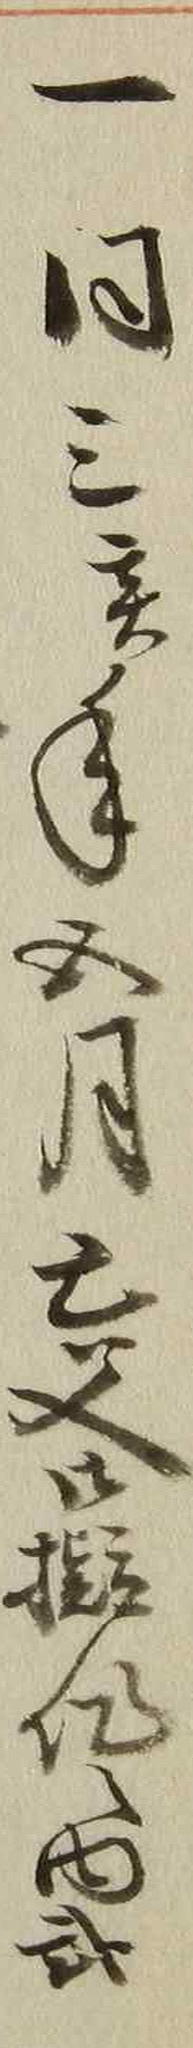一同三亥年五月亡父御擬作之内弐
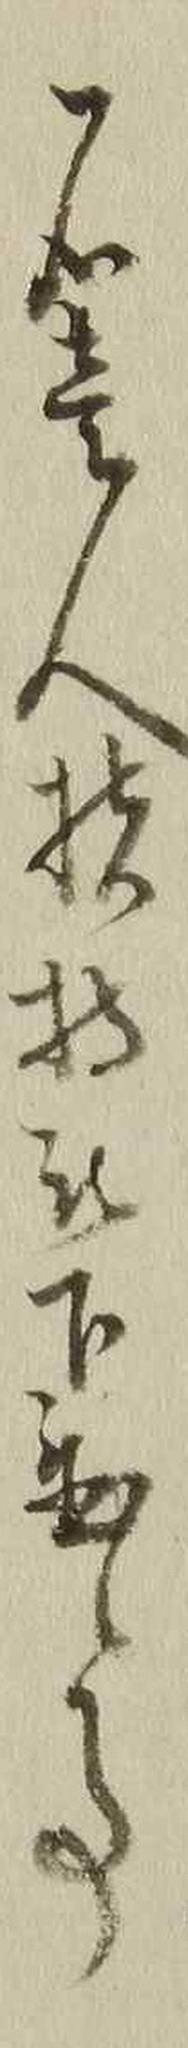石壱人扶持被下置候事
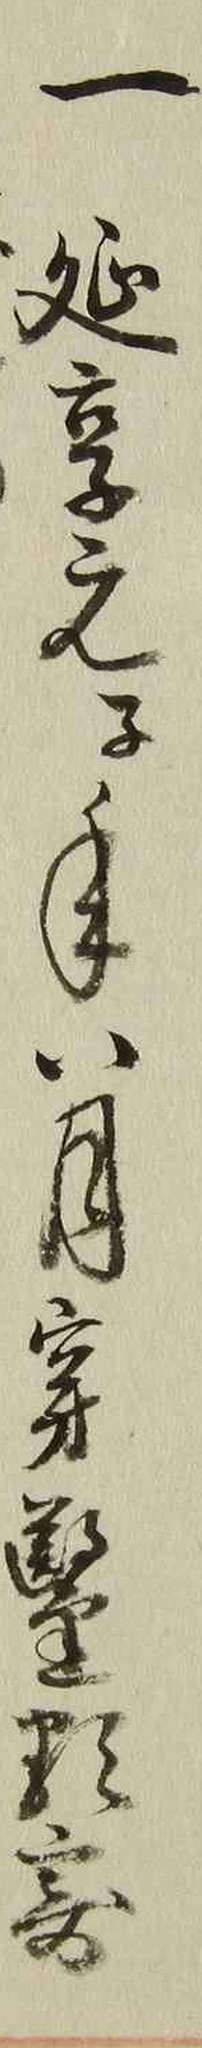一延享元子年八月穿鑿類寄
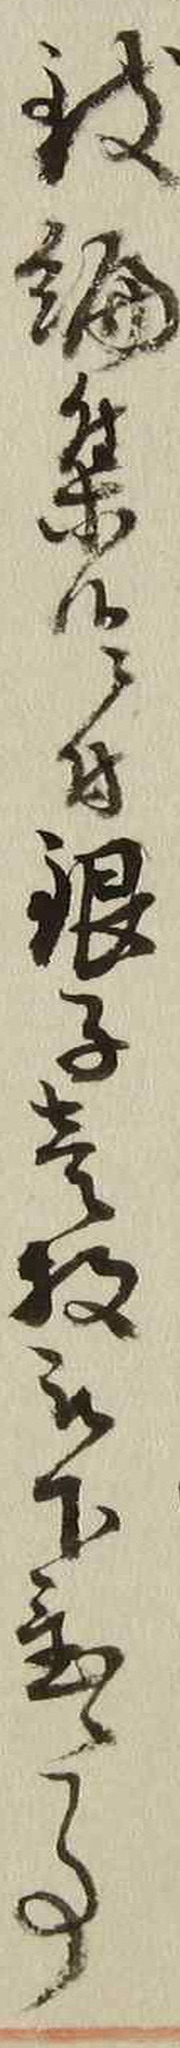致編集候ニ付銀子壱枚被下置候事
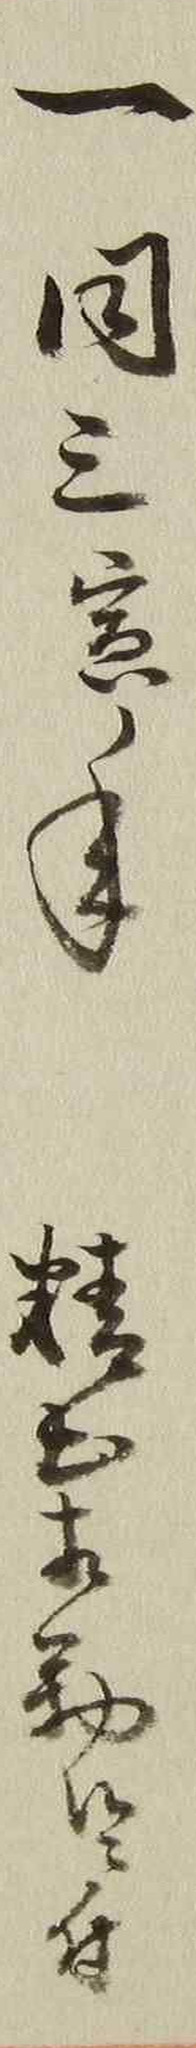一同三寅年精出相勤候ニ付
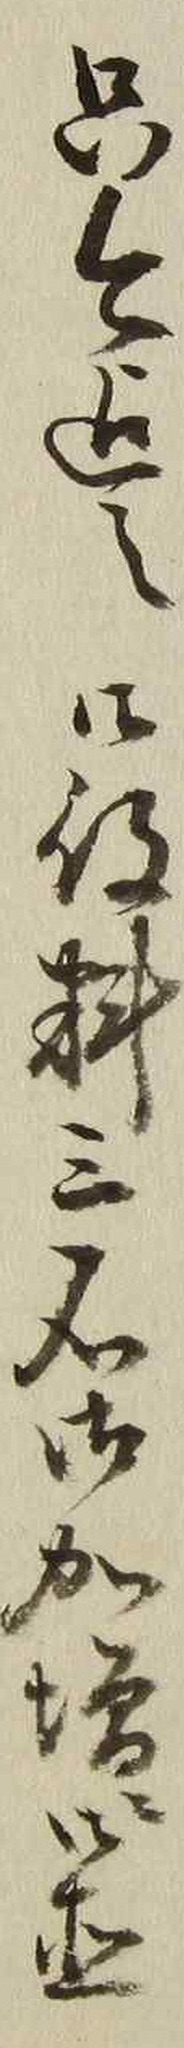只今迄之御役料三石御加増ニ御直
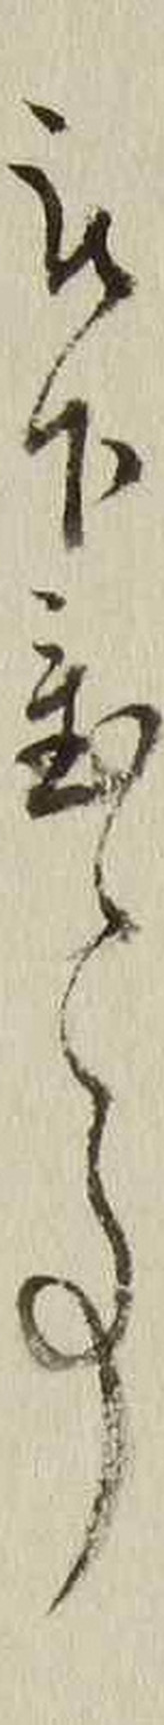被下置候事
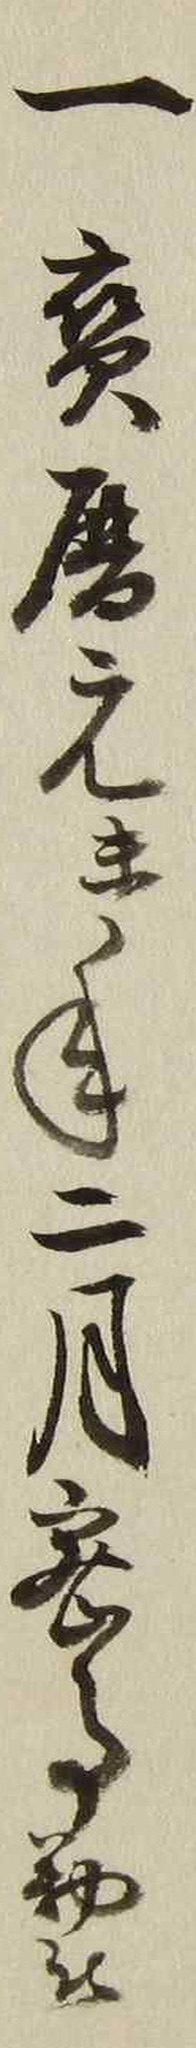一宝暦元未年二月密事勤被
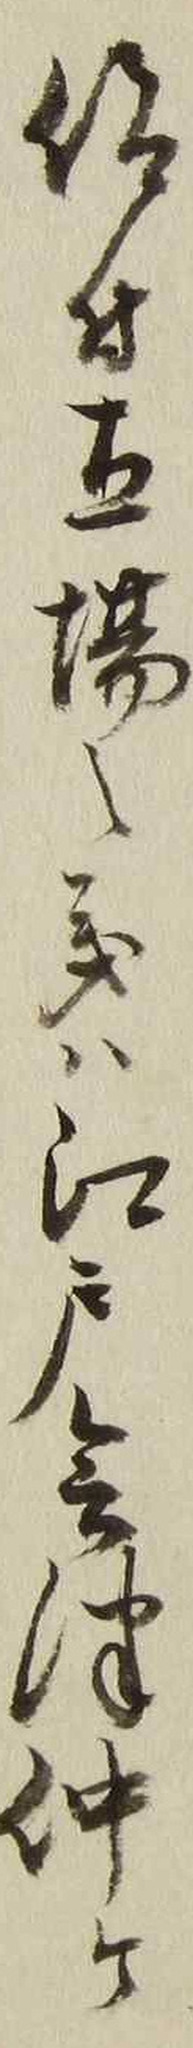仰付右場之義ハ江戸会津仲ヶ
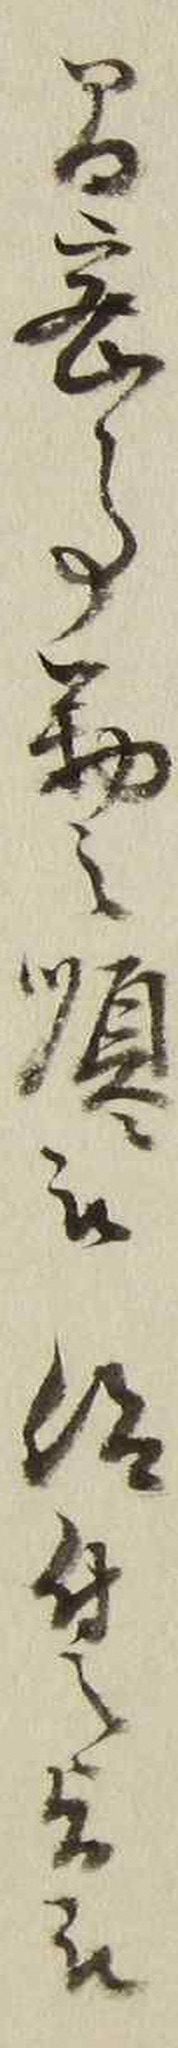間密事勤之順ニ被仰付之旨被
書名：諸士系譜　巻之53　に之部4
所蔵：会津若松市立会津図書館
